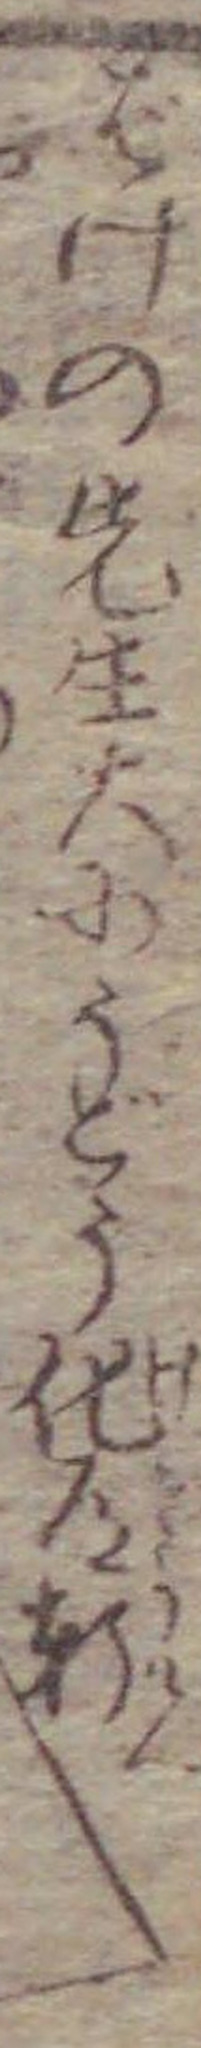ばけの先生大にうどう化道軒
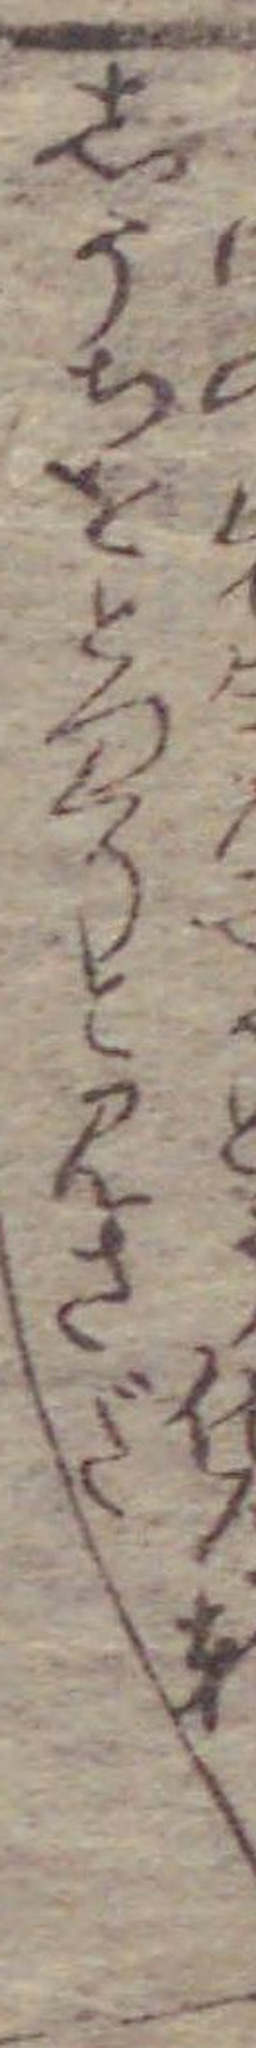しうちをとつくりと見さだ
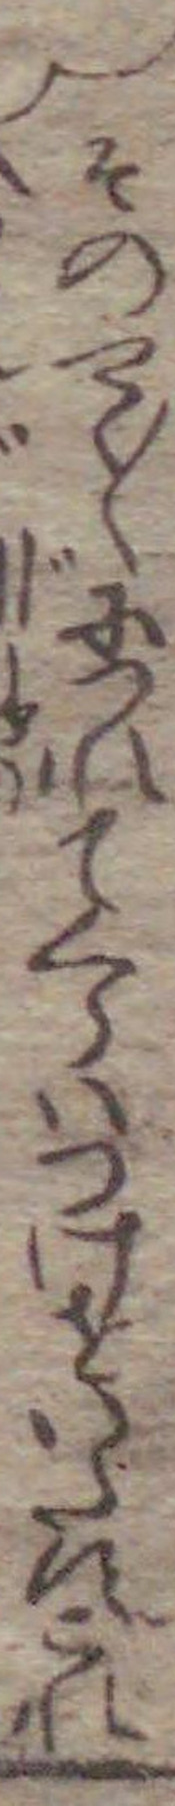そのやく〳〵につれてくらいつけをいたすこれ
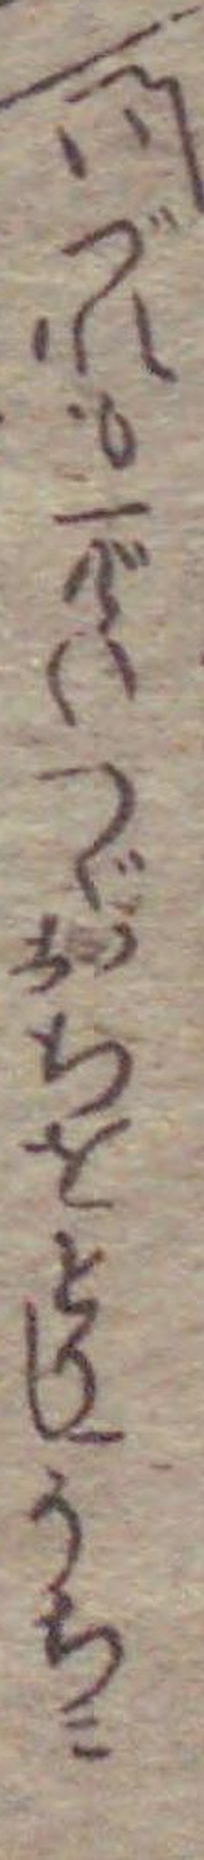〽いづれも一げいつゞおちをとりしうちに
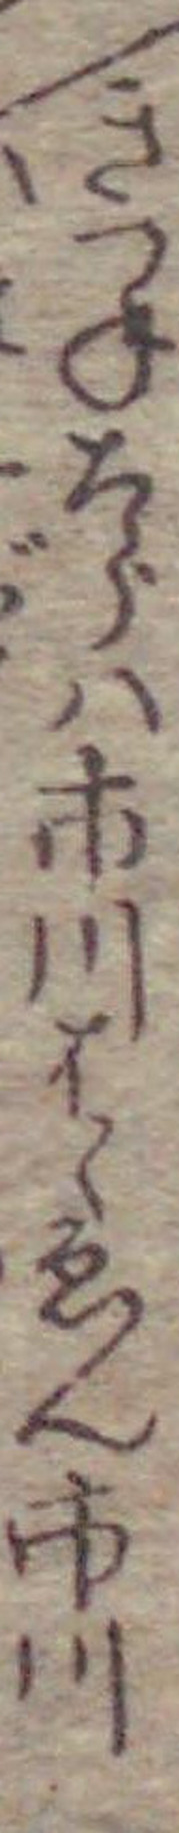きつね太郎は市川はくゑん市川
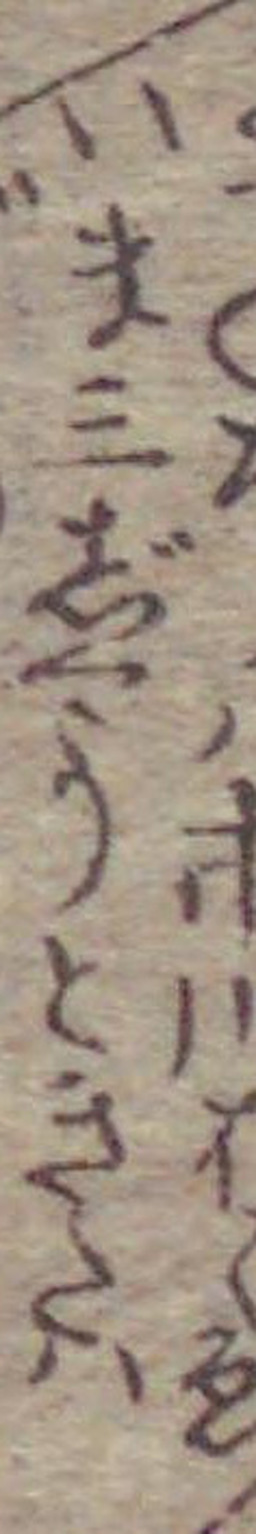いま三じやうときたは
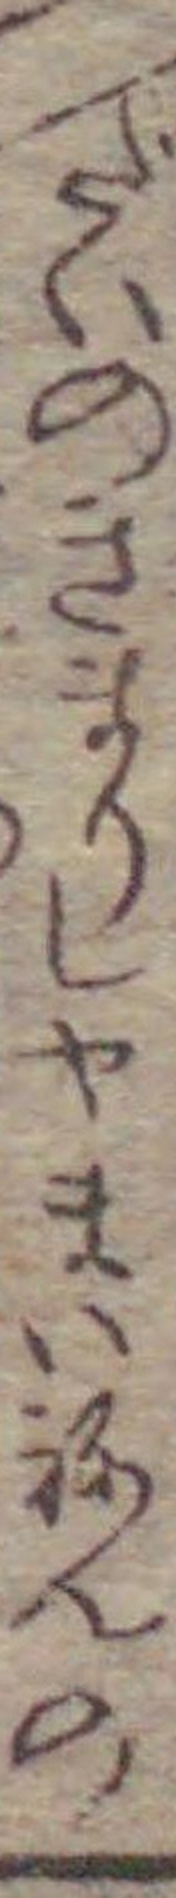だいのきまりしやまいねんの
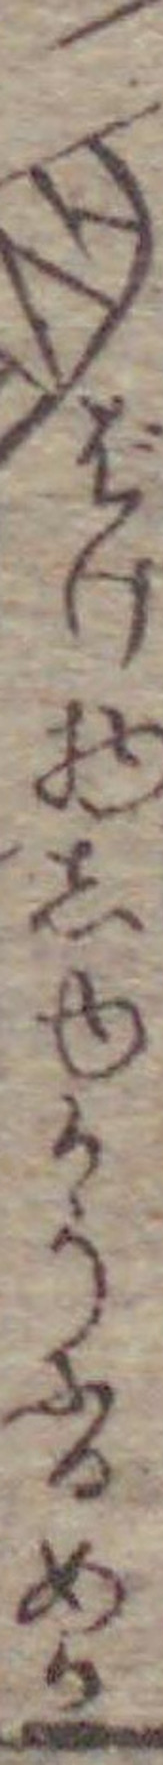ばけ物しゆかうふるめか
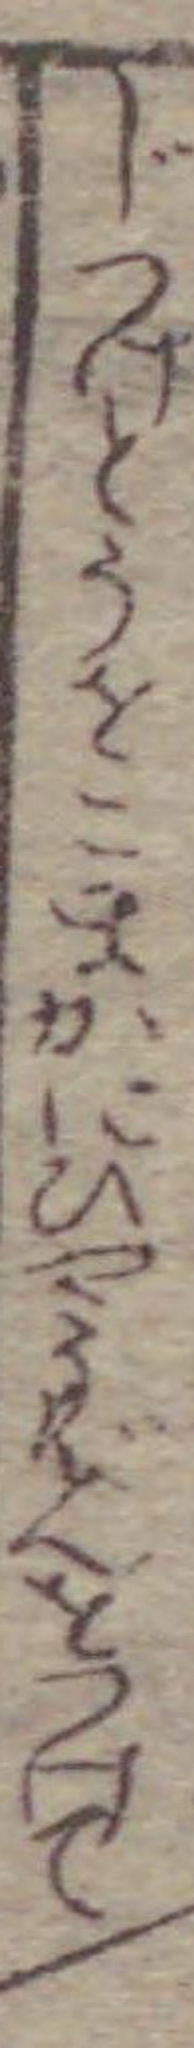じつけとうをこまかにひやうばんをつけて
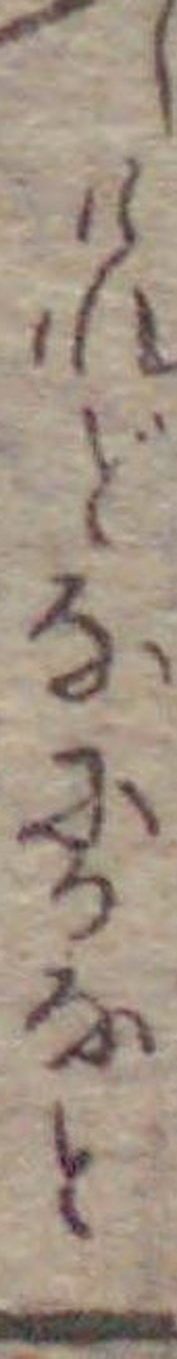しけれどなにかなと
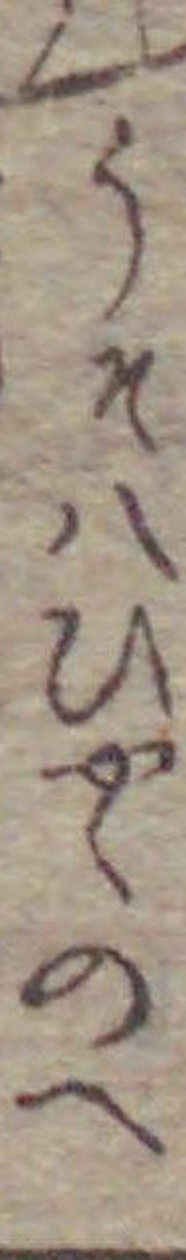うそ八ひやくのへ
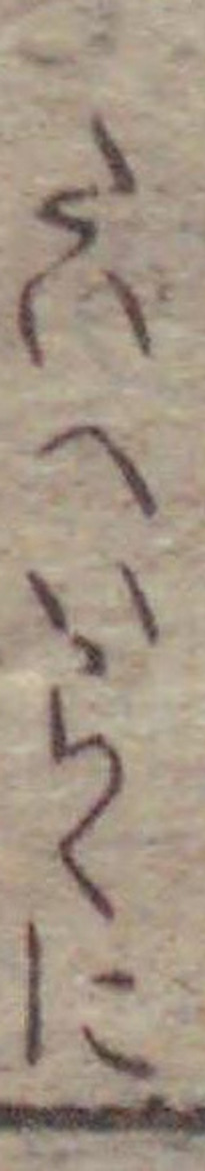たいへいらくに
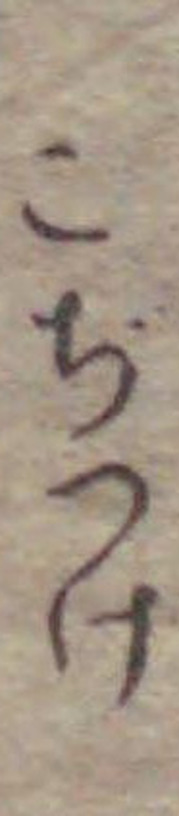こぢつけ
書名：妖怪仕内評判記 : 2巻
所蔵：国立国会図書館 National Diet Library, JAPAN
